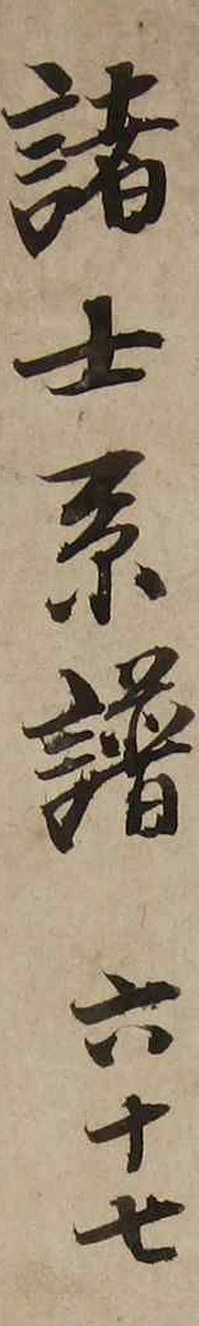諸士系譜六十七

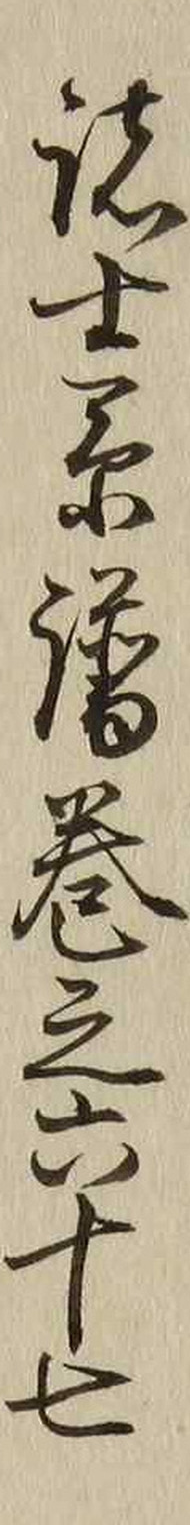諸士系譜巻之六十七
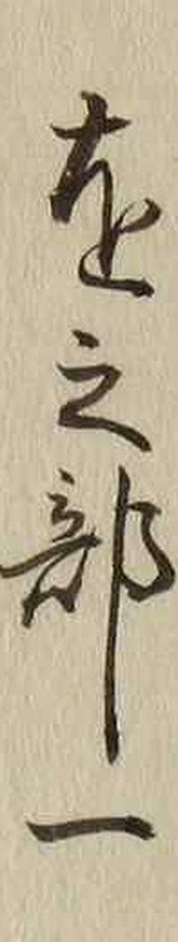を之部一
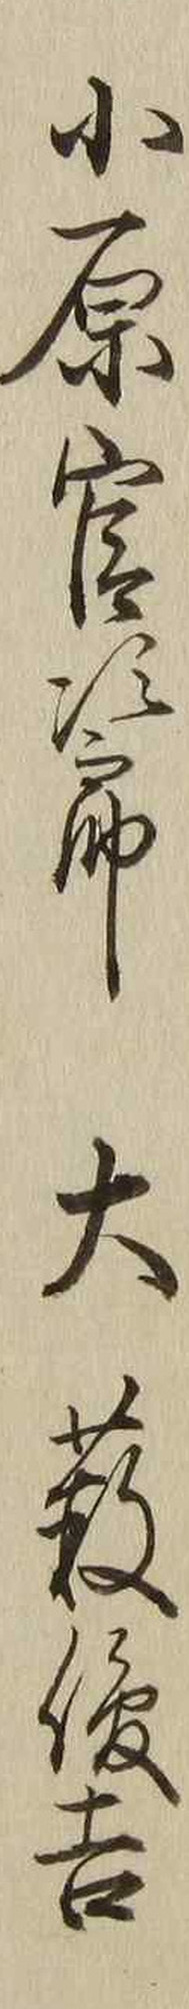小原官次郎大藪俊吉

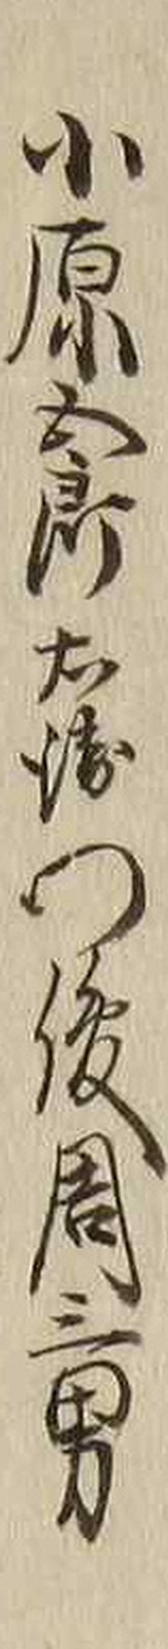小原五郎右衛門俊周三男
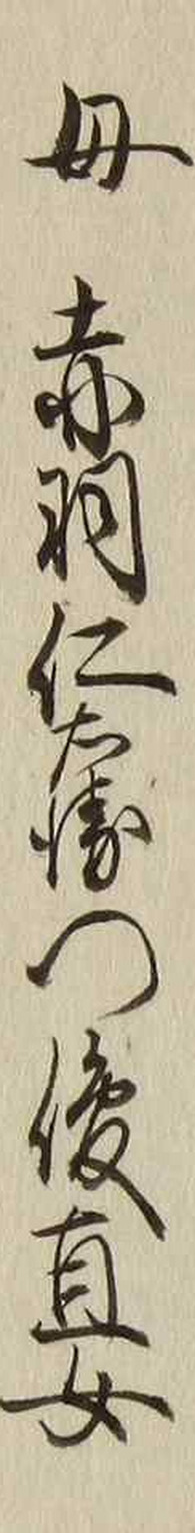母赤羽仁右衛門俊直女
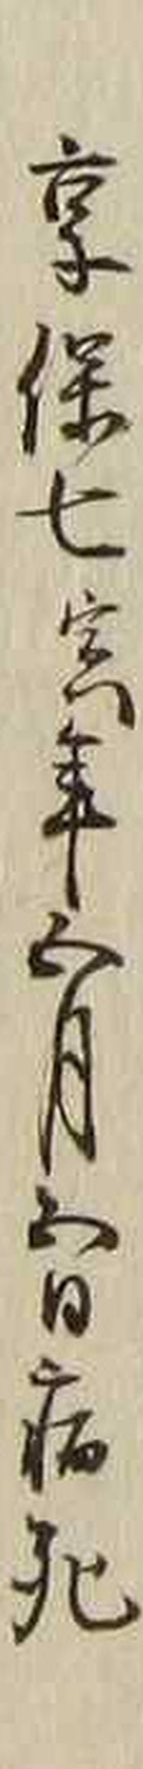享保七寅年五月五日病死
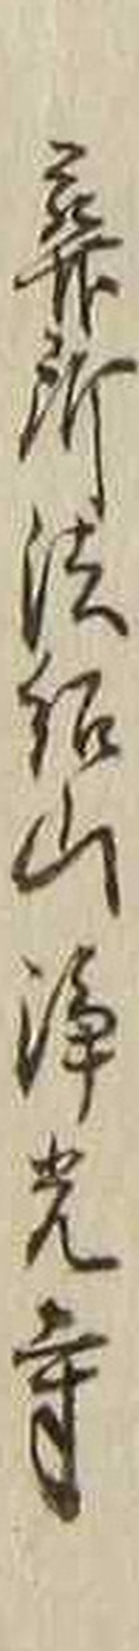葬所法招山浄光寺
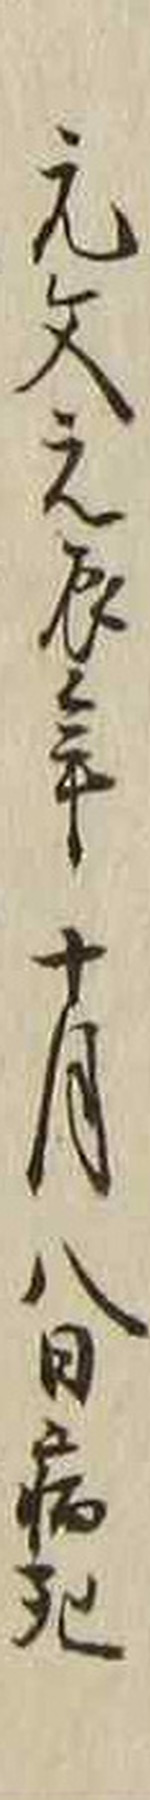元文元辰年十月八日病死
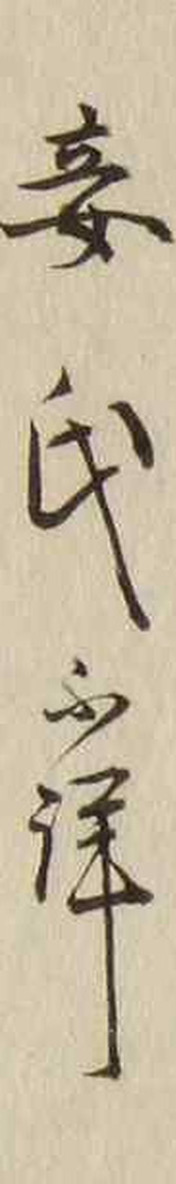妾氏不詳

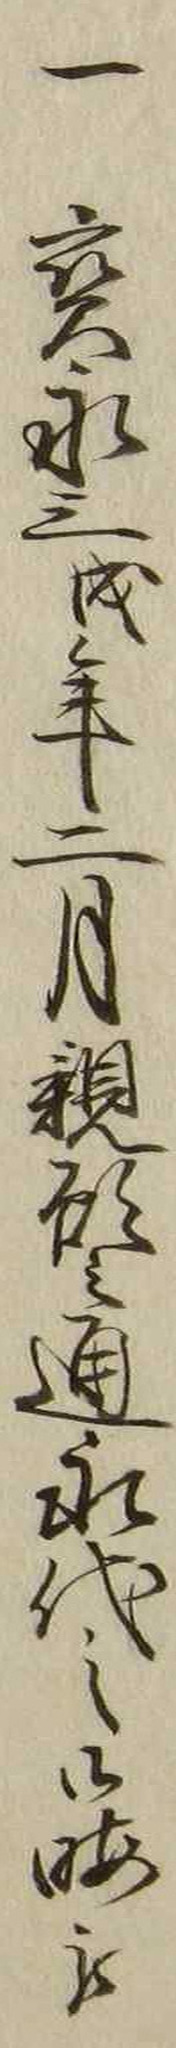一宝永三戌年十二月親願之通永代之御暇被
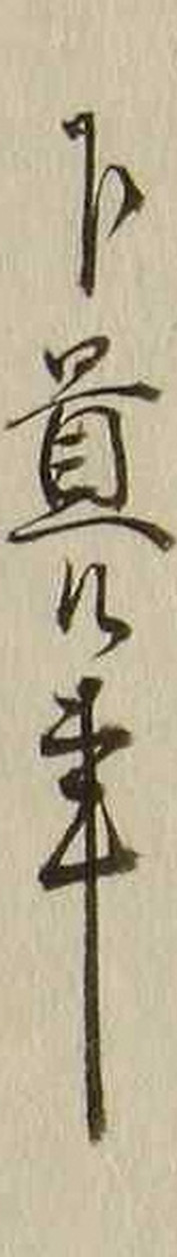下置候事
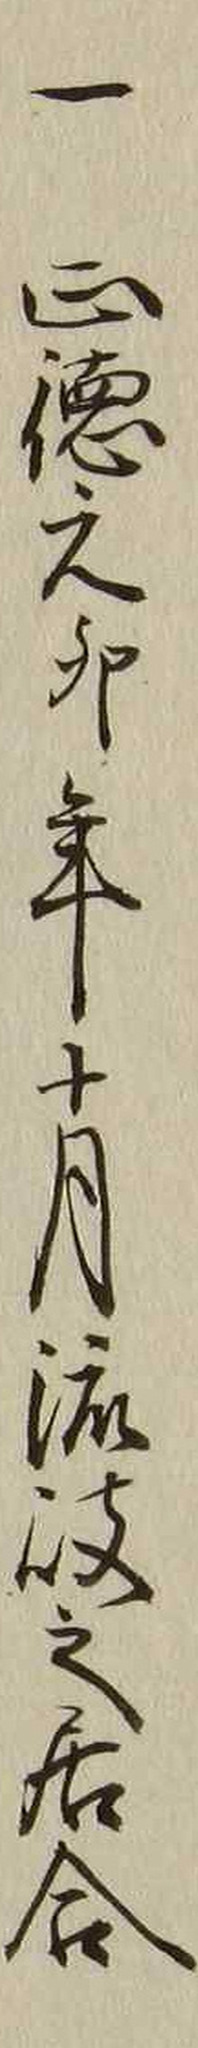一正徳元卯年十月流岐之居合
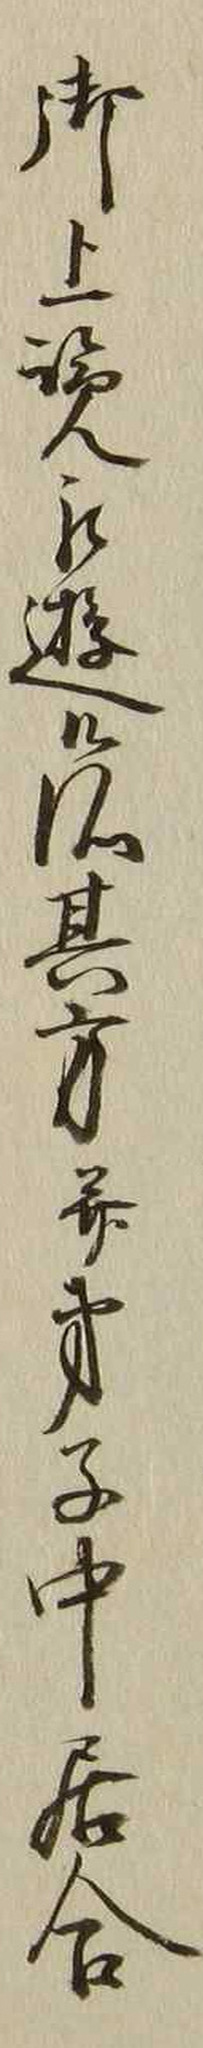御上覧被遊候所其方并弟子中居合
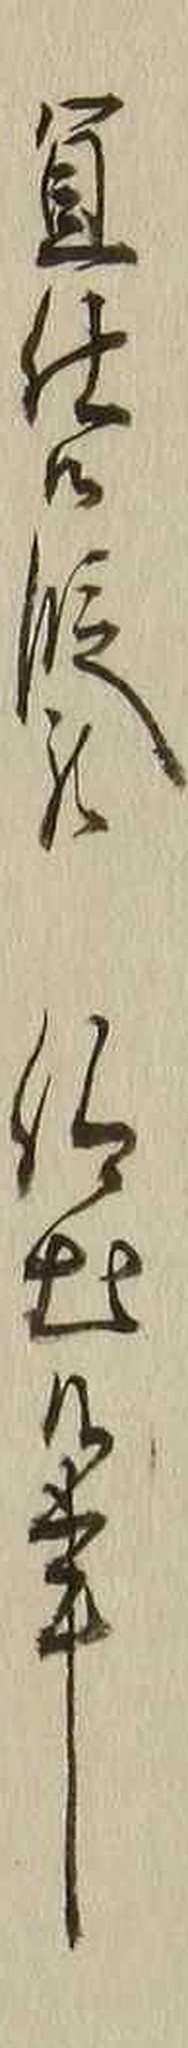宜仕候段被仰出候事
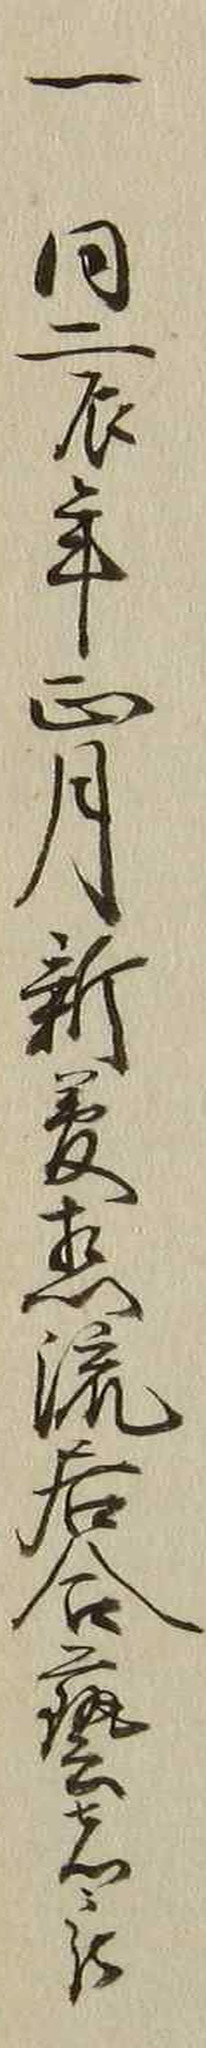一同二辰年正月新夢想流居合芸者に被
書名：諸士系譜　巻之67　を之部1
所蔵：会津若松市立会津図書館
